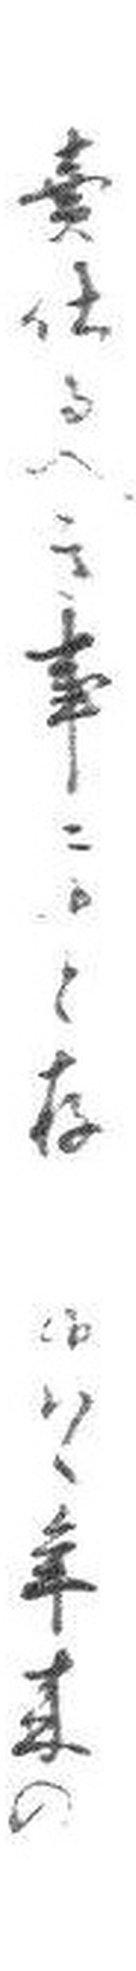売仕るへき事ニ候と存候ハヽ年来の

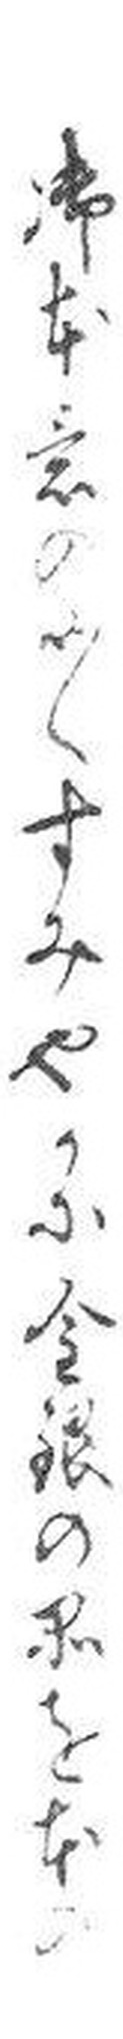御本意の如くすみやかに金銀の品を本の
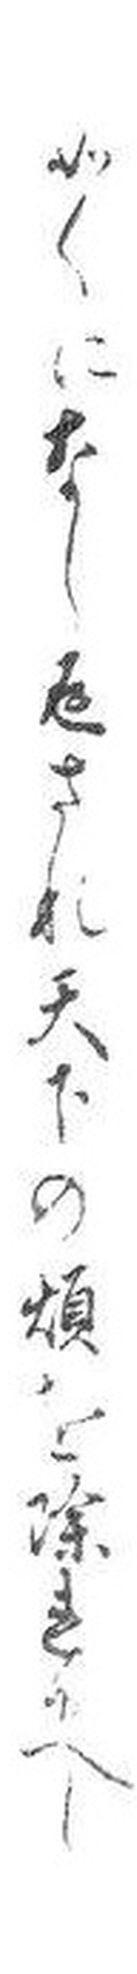如くになし返され天下の煩を除れ候へし
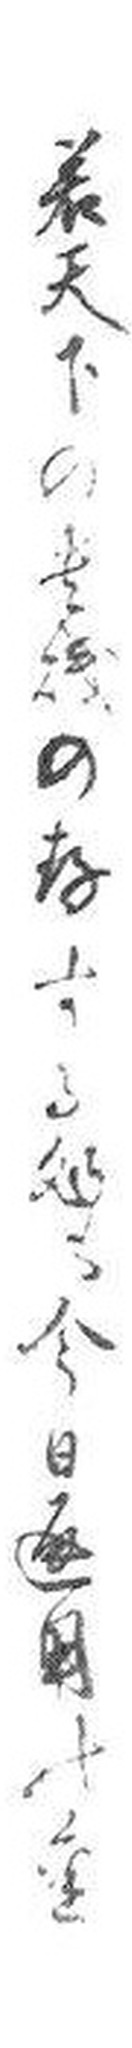若天下の貴銭の存する処も今日通用の金
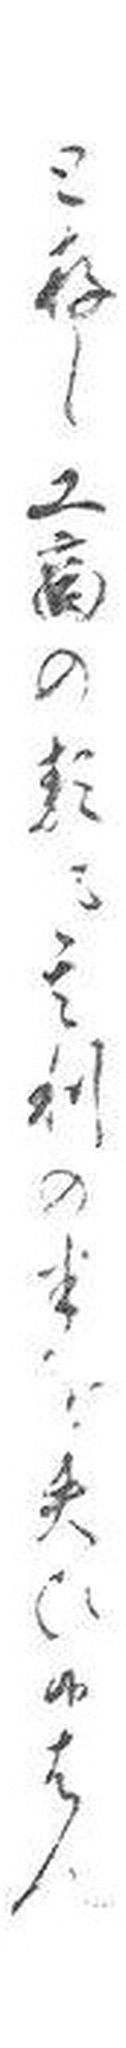と存し工商の類も其利の半を失ひ候はん
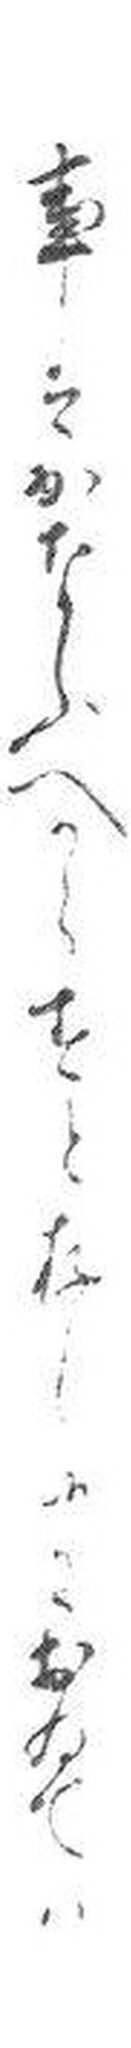事はかなしむへからすと存し候におゐてハ
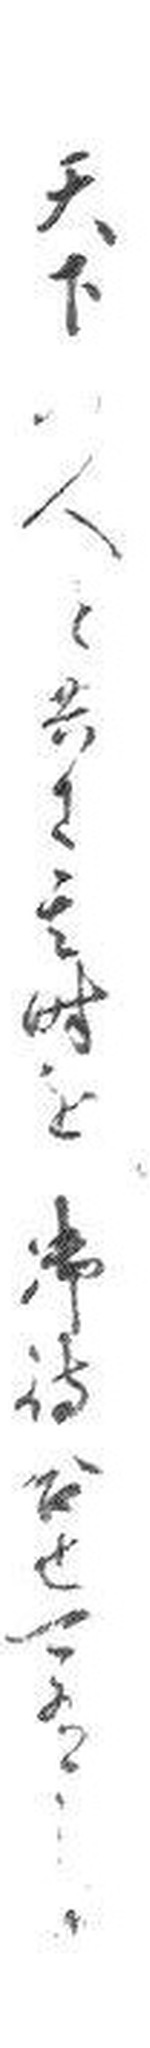天下の人と共に其時を御待合せ可有之候
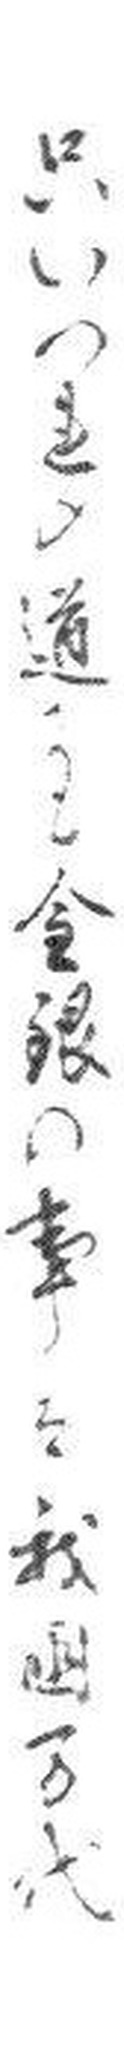只いつれの道にも金銀の事は我国万代
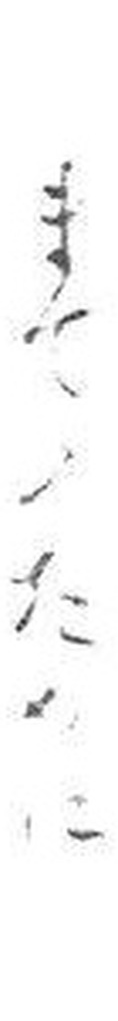まてのために
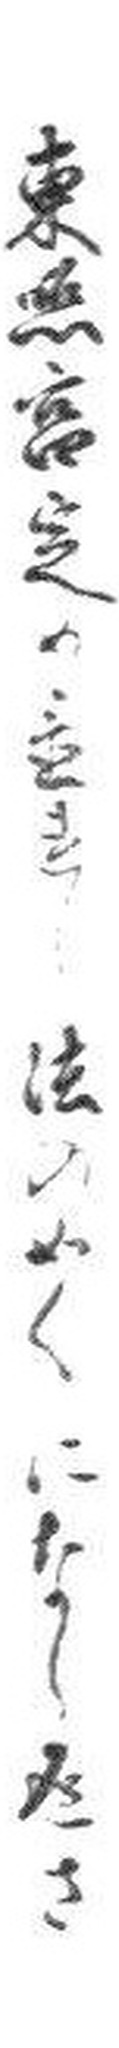東照宮定め置れし法の如くになし返さ
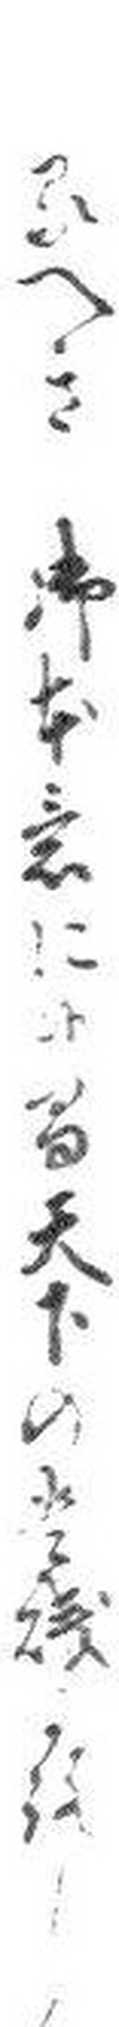るへき御本意に候間天下の貴銭よろしく
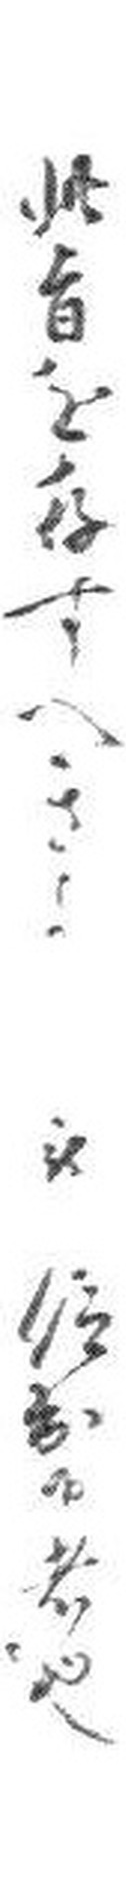此旨を存すへきに被仰出候者也
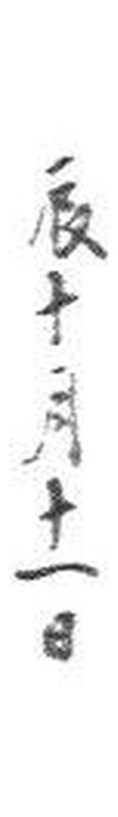辰十月十一日
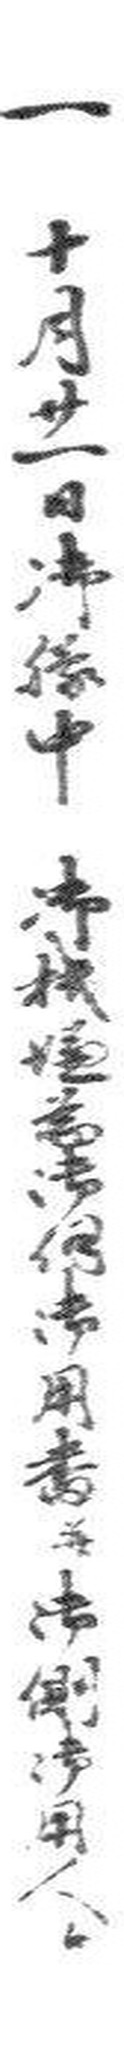一十月廿一日御蒙中御機嫌為御伺御用番并御側御用人江
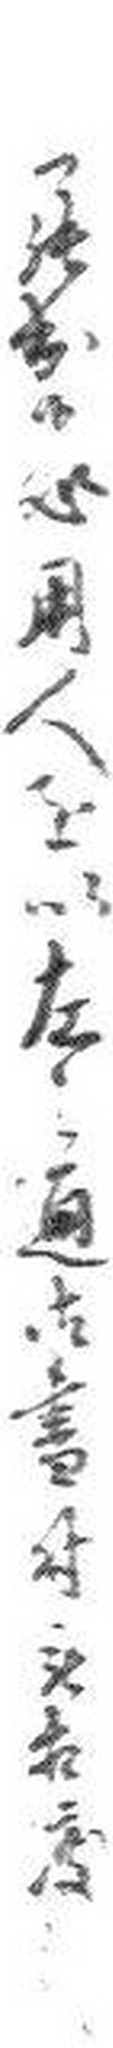罷出候処用人を以左之通御書付被相渡之
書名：家譜 二十九 吉邦公 従正徳二年到正徳三年
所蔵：福井県文書館 Fukui Prefectural Archives
